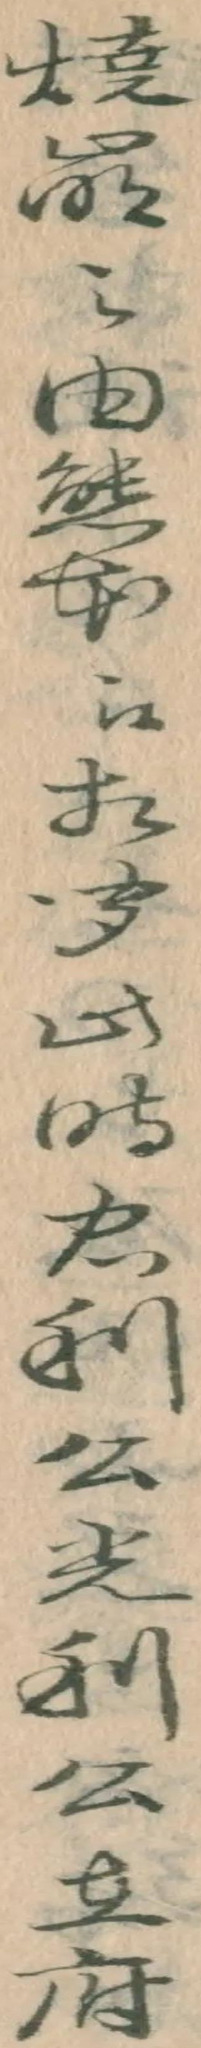焼崩之由熊本江相聞此時忠利公光利公在府

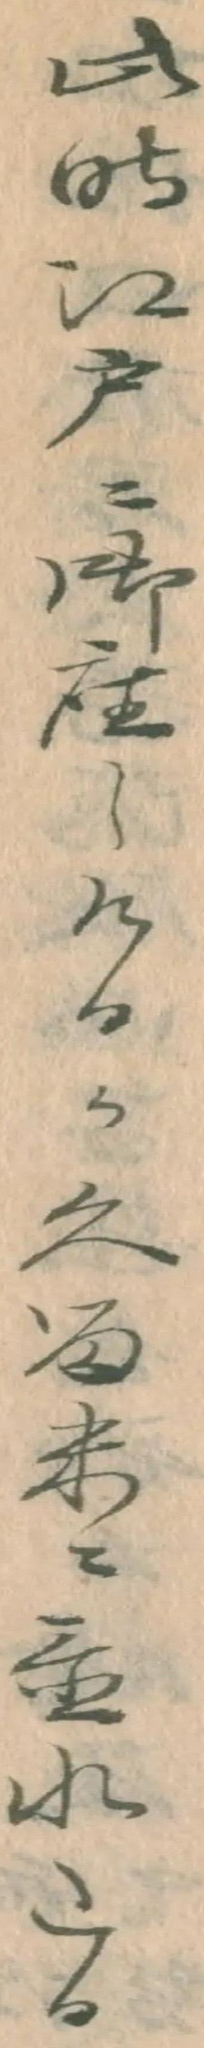此時江戸に御座しけるか久留米に置れたる
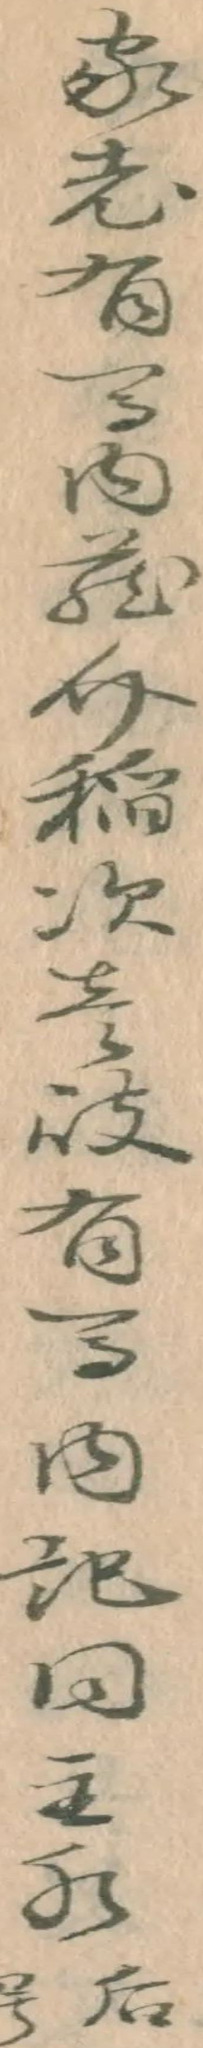家老有馬内蔵介稲次壱岐有馬内記同主水后号
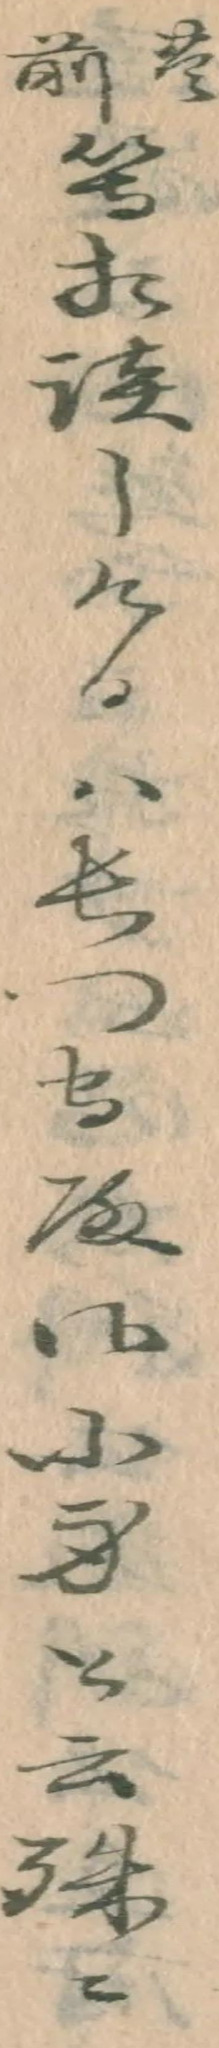豊前等相談しけるは長門守殿御小身と云殊に
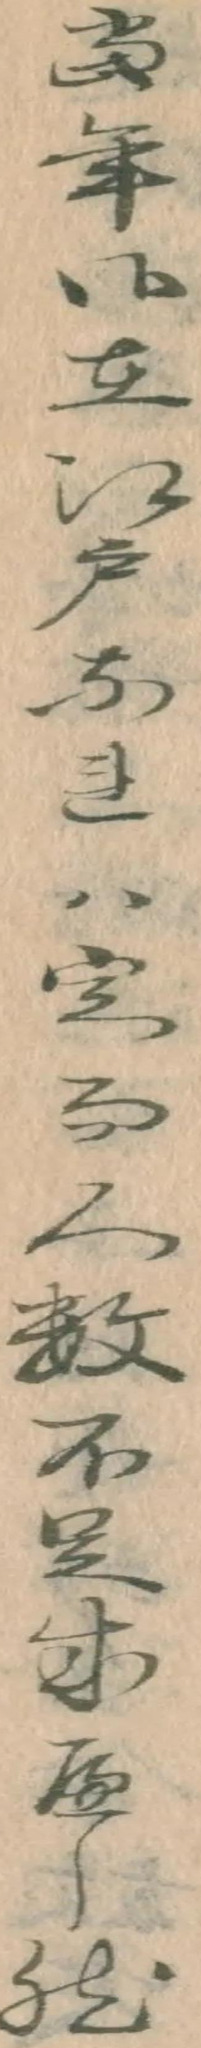当年御在江戸な連は定而人数不足成扁し然
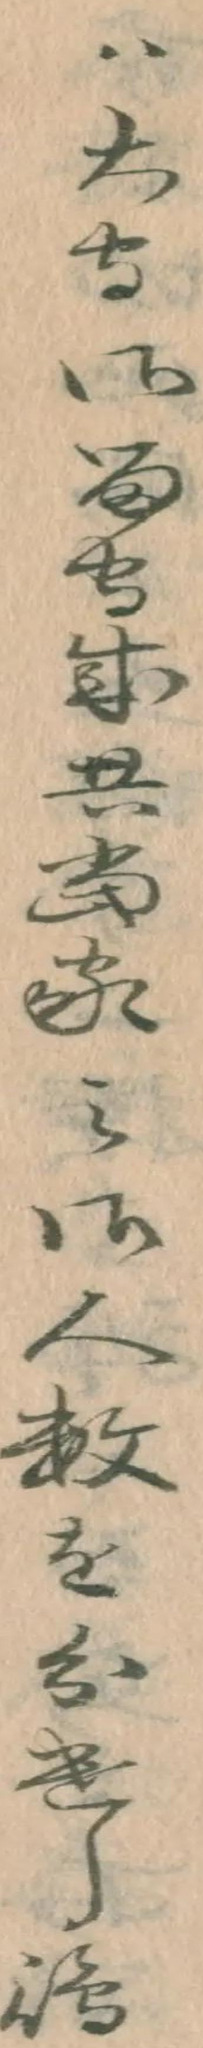は大守御留守成共当家之御人数を分遣し島
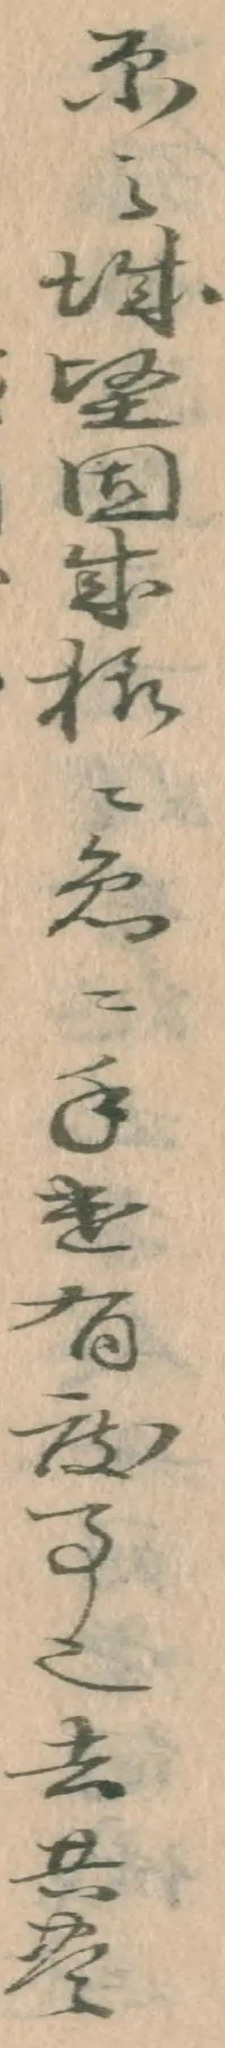原之城堅固成様に急に手遣有度事也去共豊
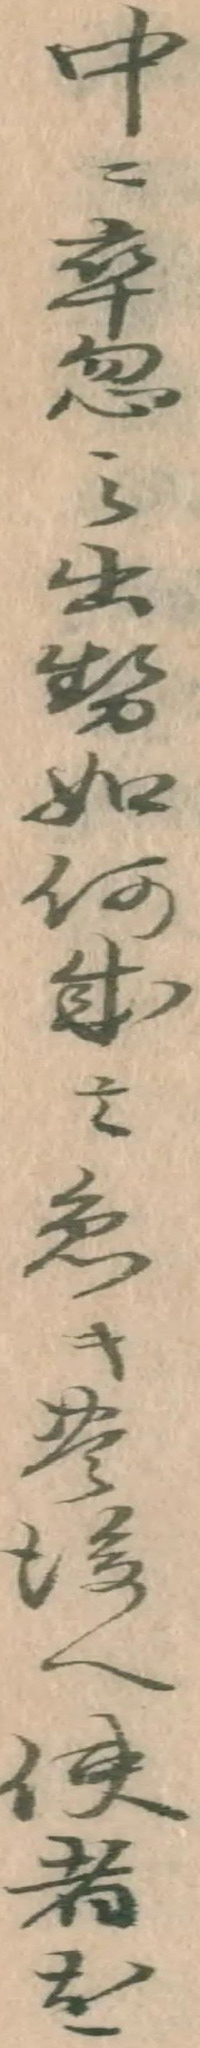中に卒忽之出勢如何成者急き豊後へ使者を
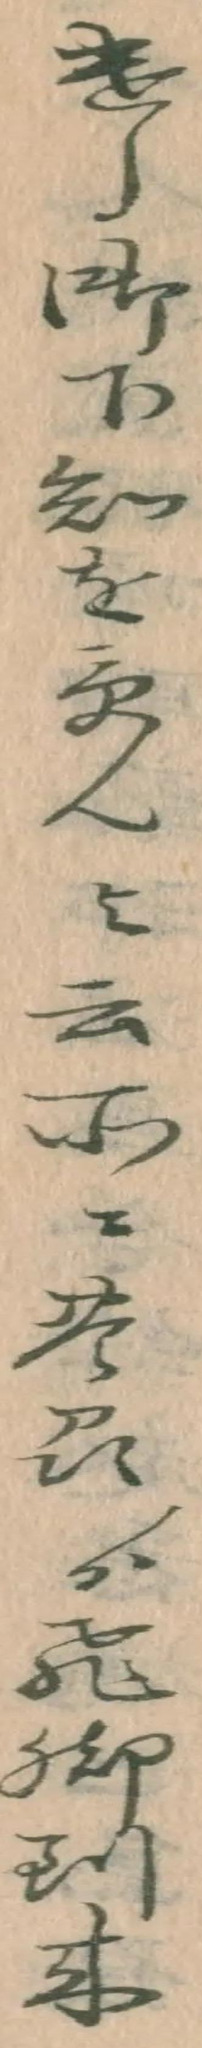遣し御下知を受ん与云所に豊州ゟ飛脚到来
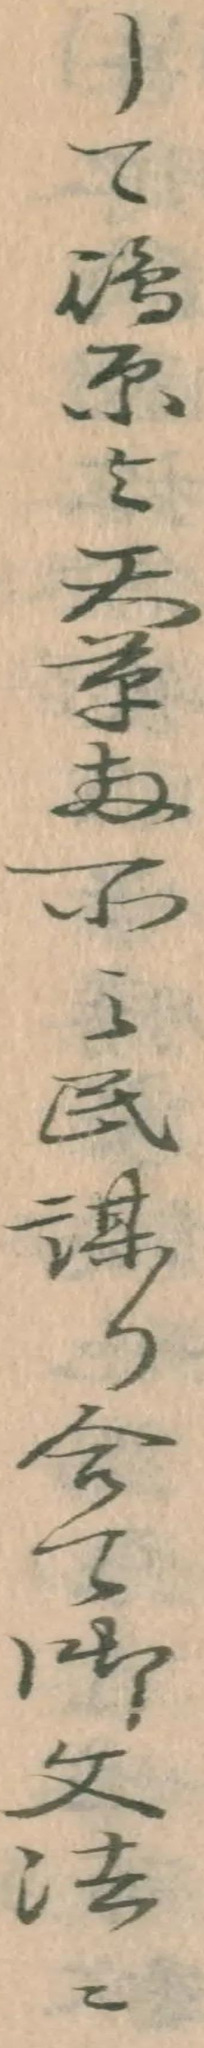して島原与天草両所之民謀り合て御文法に
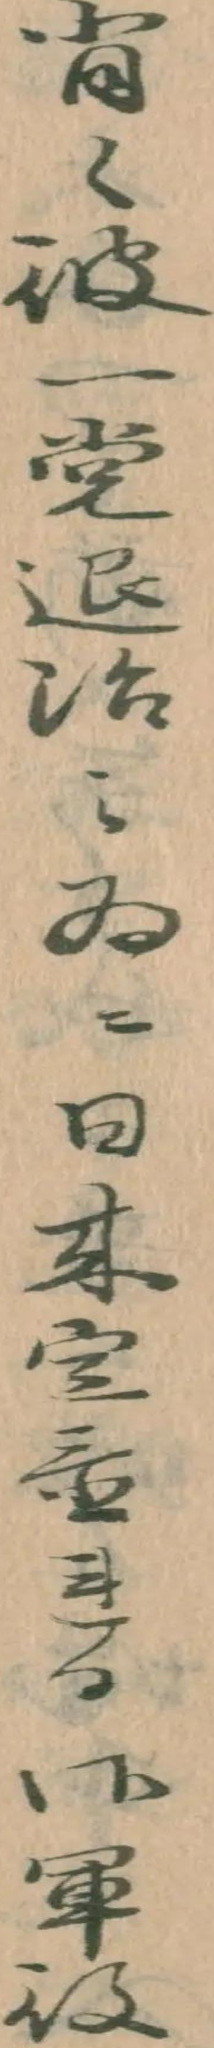背く彼一党退治之ゐに日来定置連る御軍役
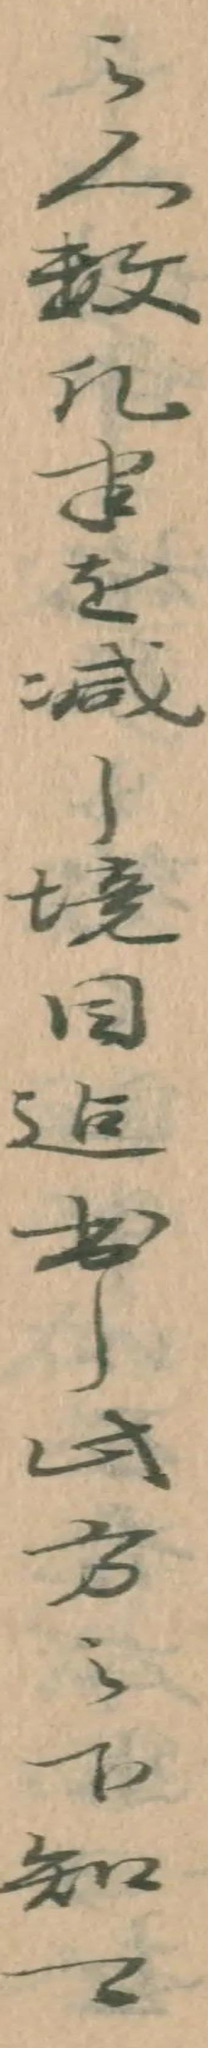之人数凡半を減し境目迄出し此方之下知可
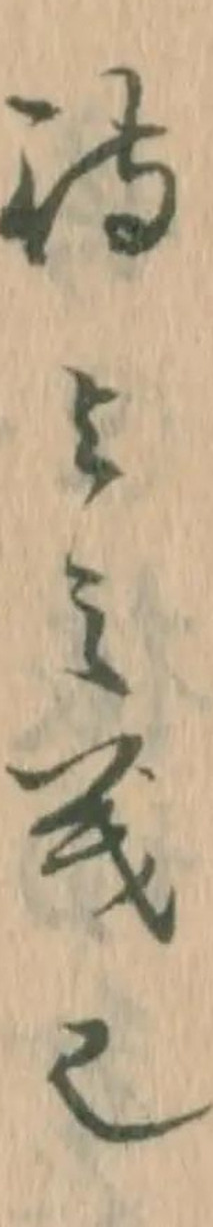待与之義也
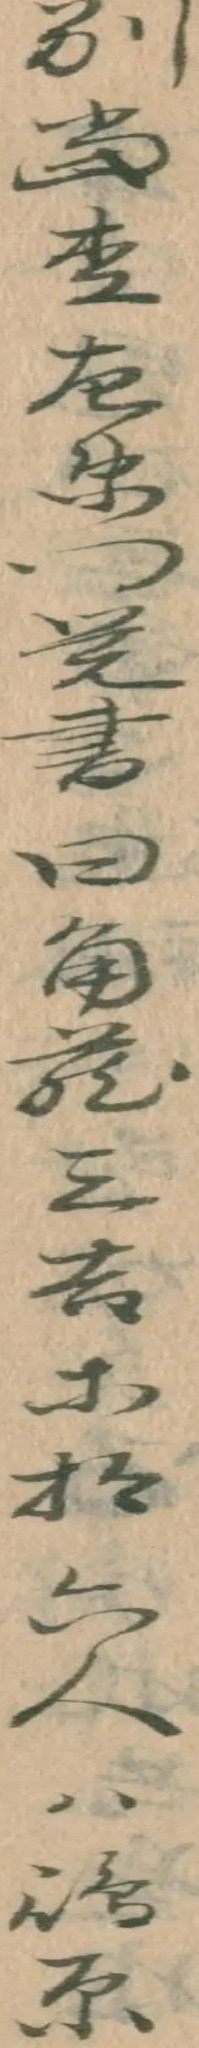別当杢左衛門覚書曰角蔵三吉等拾六人は島原
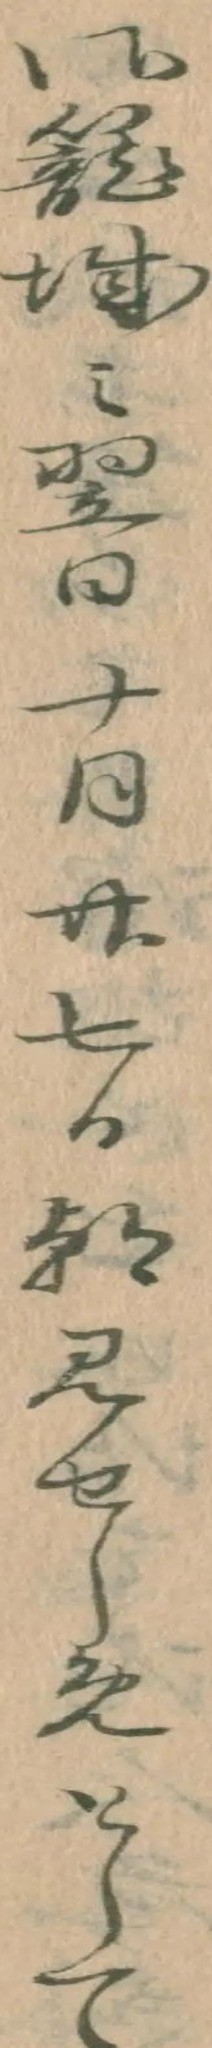御籠城之翌日十月廿七日朝見せし免として
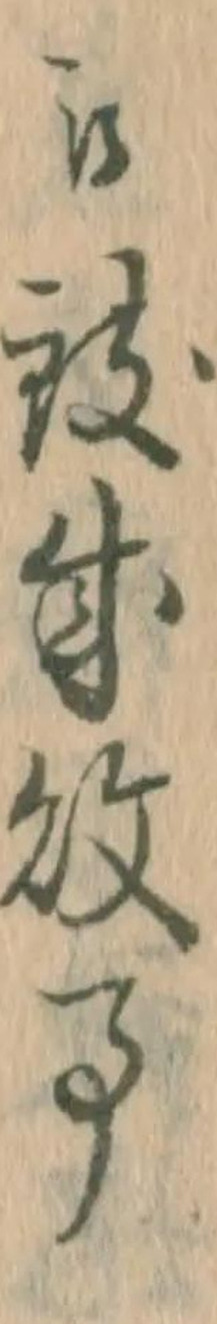被致成敗事
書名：切支丹御退治記 49巻. [2]
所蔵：国立国会図書館 National Diet Library, JAPAN
